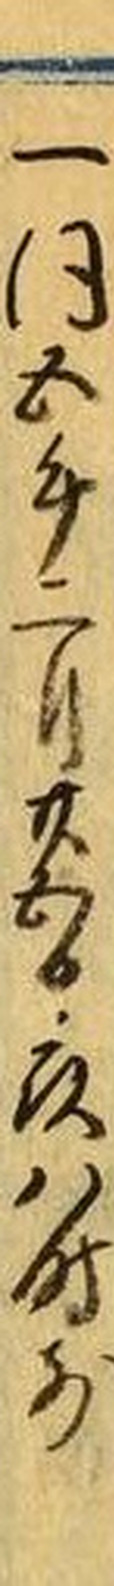一同五午二月廿五日夜八時前
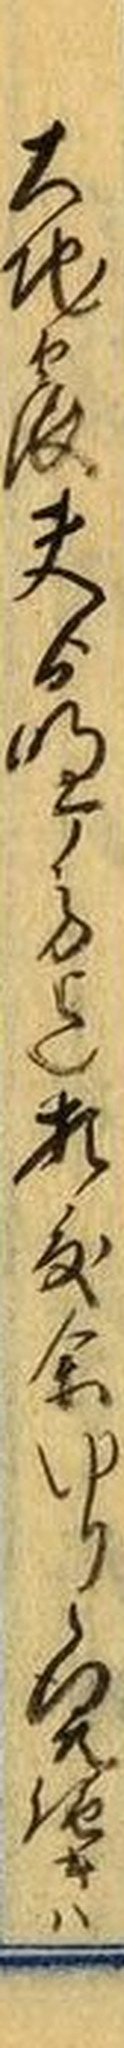大地震夫ゟ明ケ方迄数度余ゆり候得共強キハ
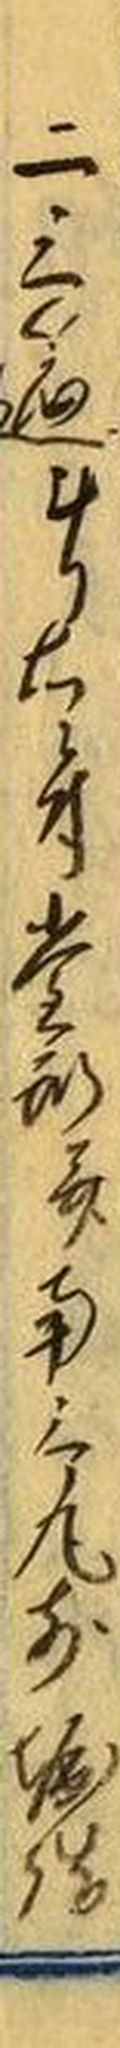二三遍斗り右ニ付堂形并南三ノ丸前堀端
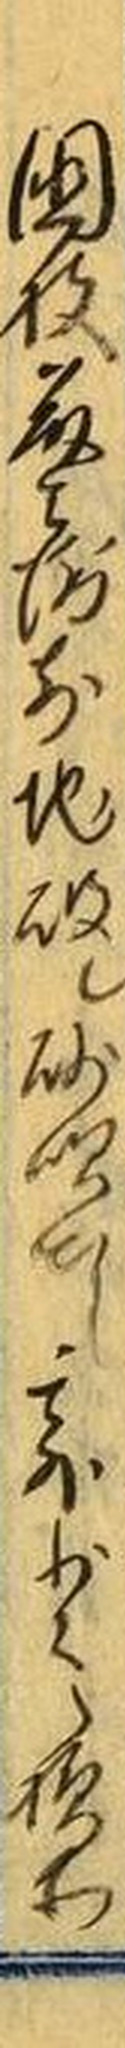国枝藤兵衛前地破レ砂吹出し其外少々之損所
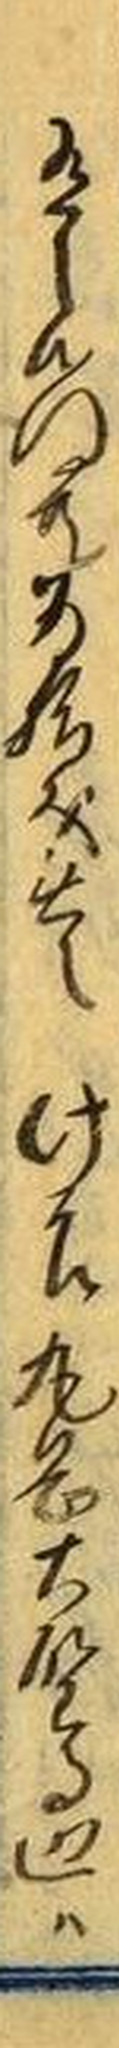有之候得共為指義無之此節丸岡大聖寺辺ハ

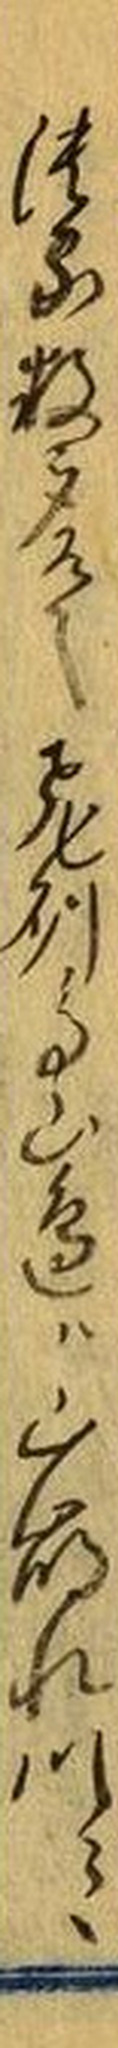潰家数多有之飛州高山辺ハ山崩れ川々へ
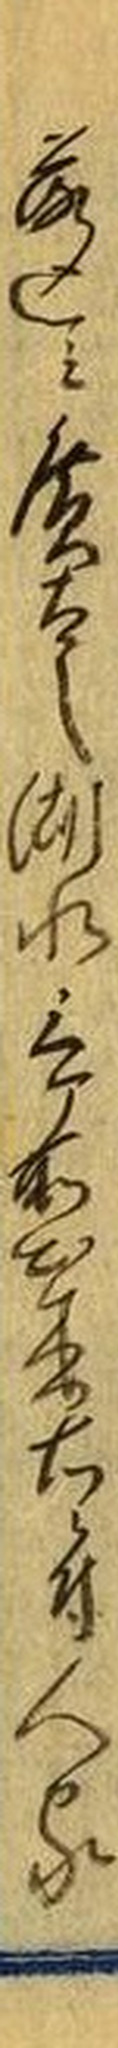落込ミ広大之湖水三ヶ所出来右ニ付人家
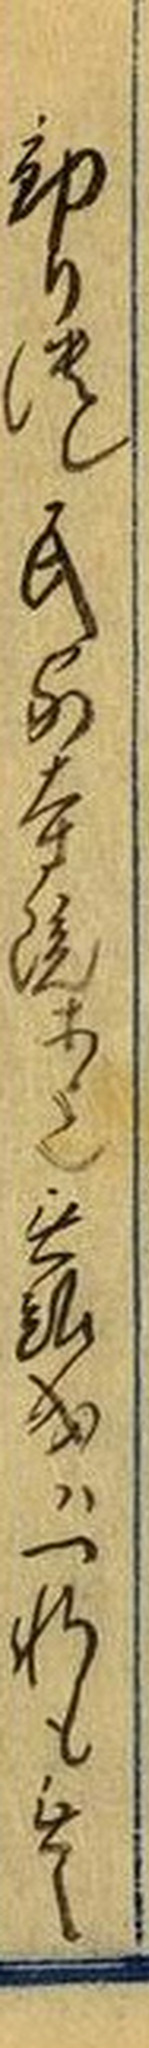動り潰レ民家寺院等迄無難成ハ一軒も無之
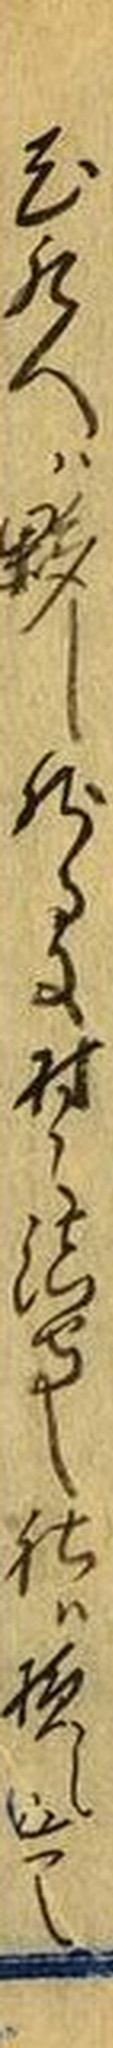尤死人ハ夥し然るに村々鎮守之社ハ損し無之
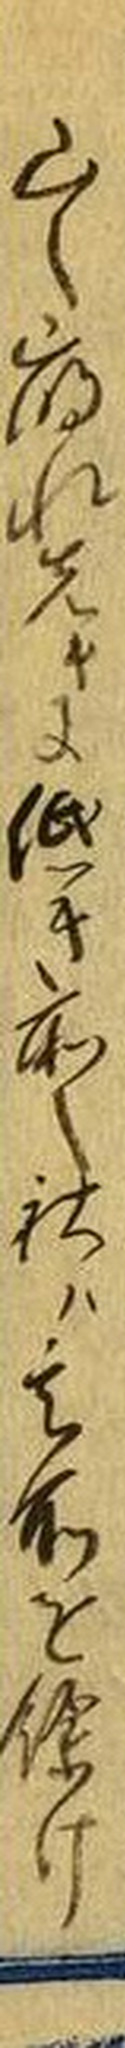山之崩れ先キに低キ所之社ハ其所を余け
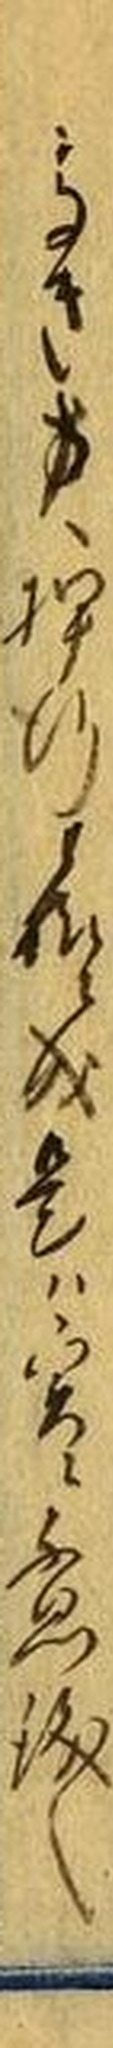高き方へ押行候様ニ成是ハ実ニ不思議之
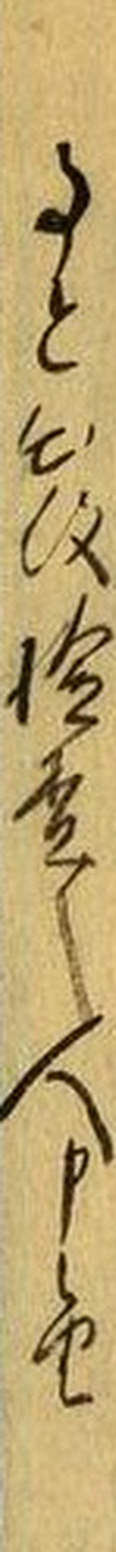事と出役検査之人申候由
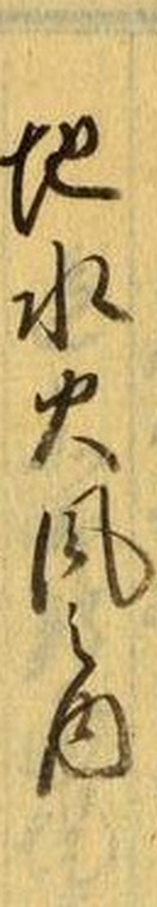地水火風之内
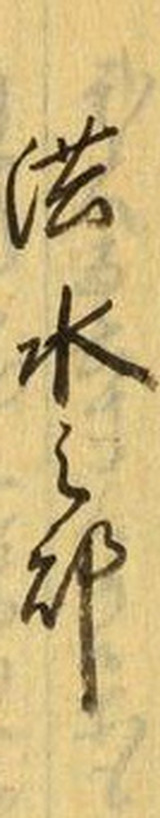洪水之部

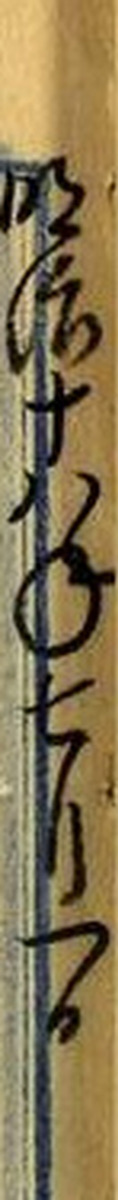明治十八年七月一日
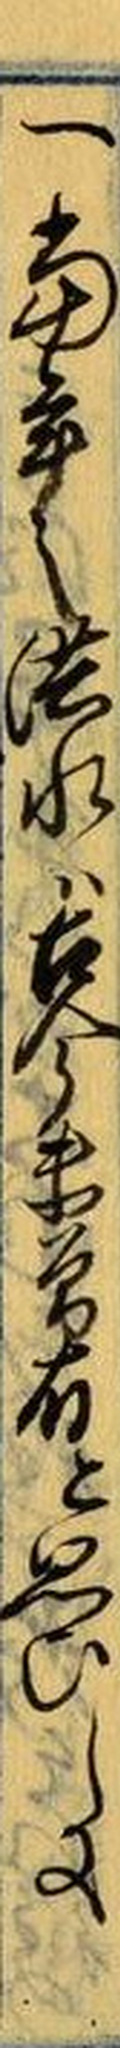一当年之洪水ハ古今未曾有と思ひしに
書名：温古集 五巻
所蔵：福井県文書館 Fukui Prefectural Archives
